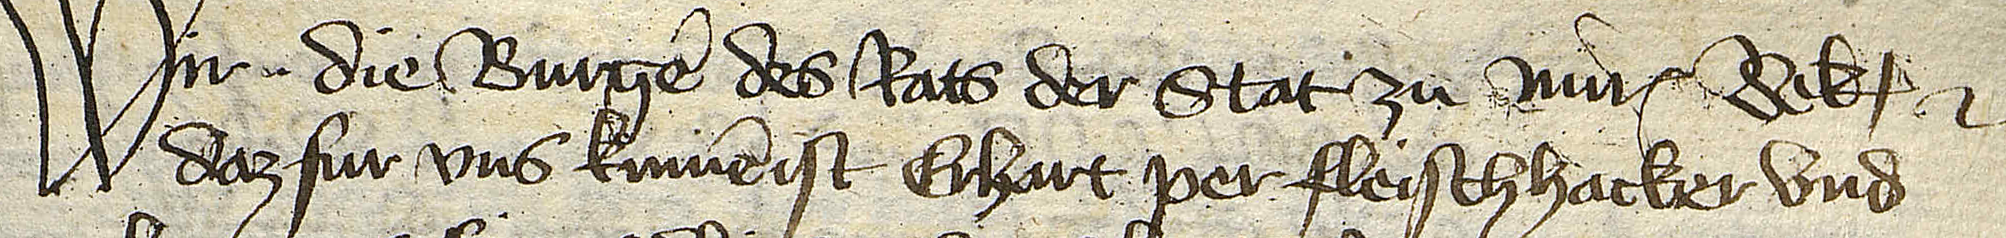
Wir ~ die Burge* des Rats der Stat ʒu Nur* Bek* ec*
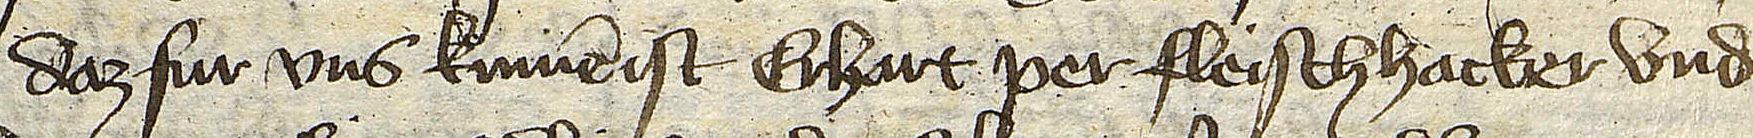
daʒ fur vns kume* iſt Erhart per fleiſchhacker vnd
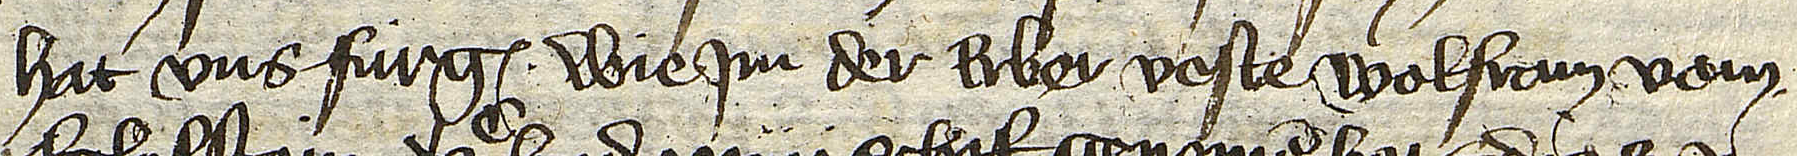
hat vns fürg* . wie Im der Erber veſte wolfram vom
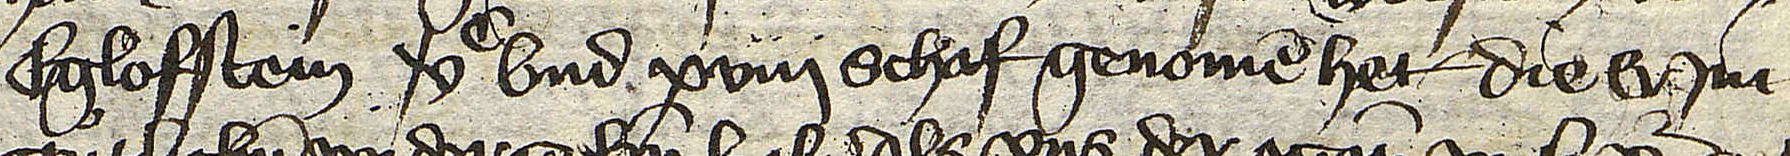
Eglofſtein v* vnd xviiii Schaf genome* het / die Er Im
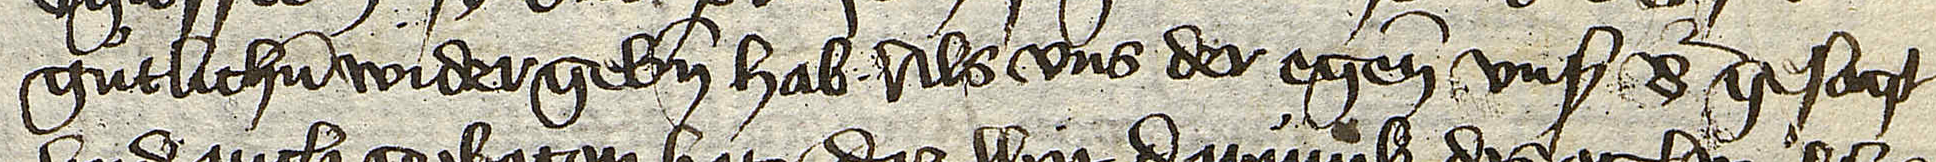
gütlichn* widergebn* hab . Als vns der egen* vnſ* B* geſagt
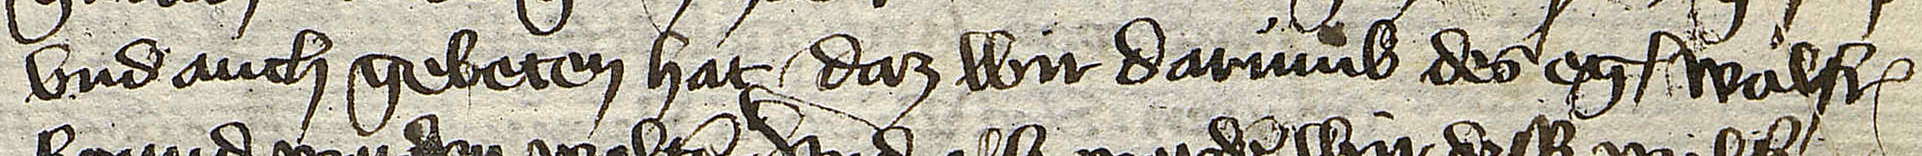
vnd auch gebeten hat / daʒ wir darümb des eg* wolfr*
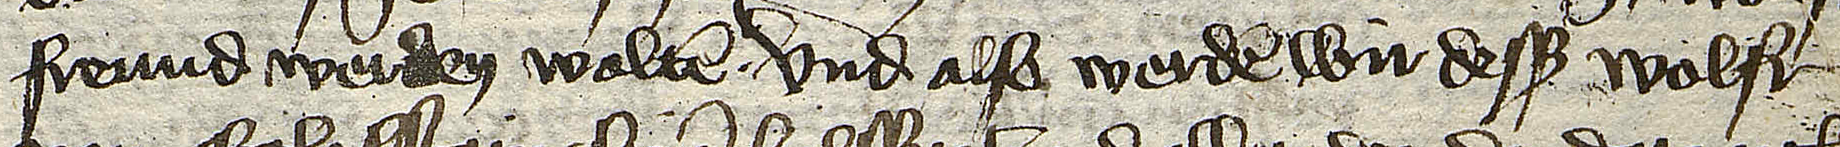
freund werden wolte* . Vnd alſo werde* wir deſſ* wolfr*
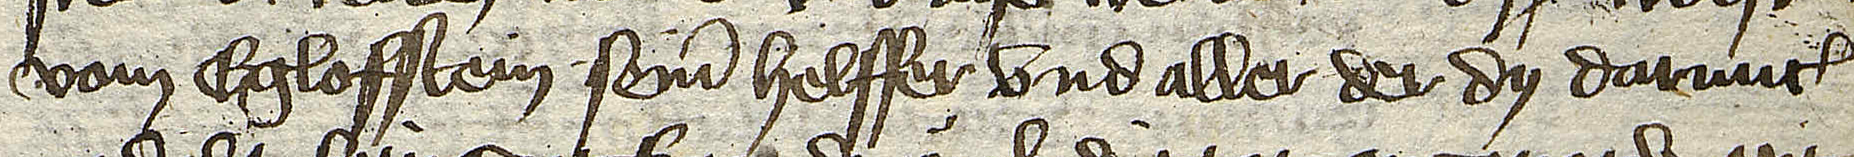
vom Eglofſtein . ſein* helffer vnd aller der dy darunt*
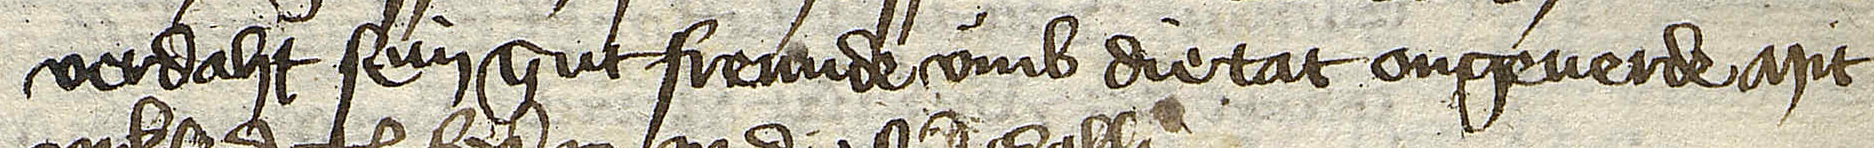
verdaht ſein gut freunde v̈mb die tat ongeuerde Mit
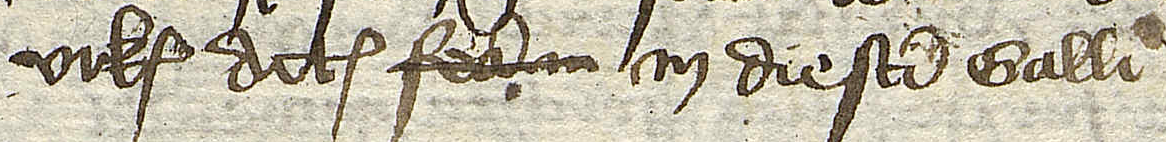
vrk* Act* fea* an in die ſci* Galli
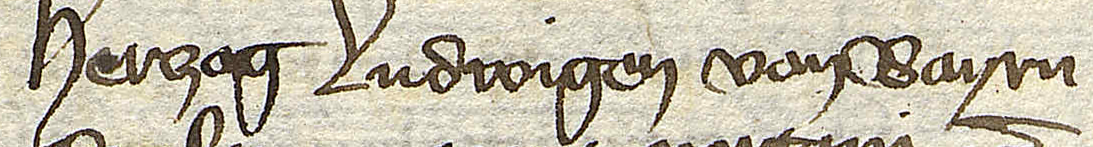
Hercʒog Ludwigen von Bayrn
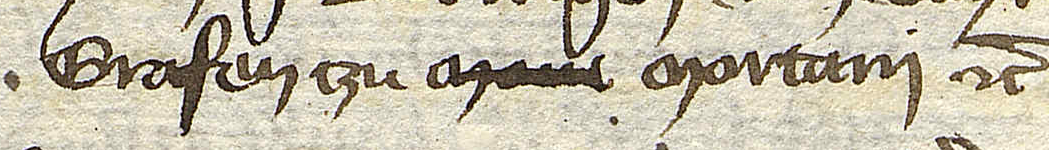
Grafen cʒu Mont Mortani ec*
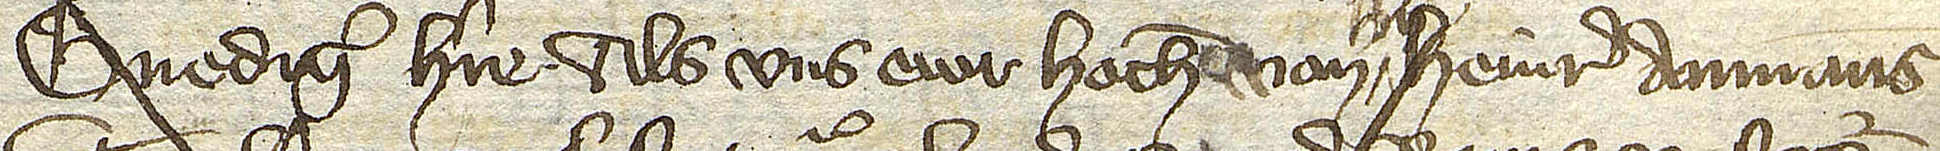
Gnedig* h*re . Als vns ewr hoch* von heinr* Armman*s
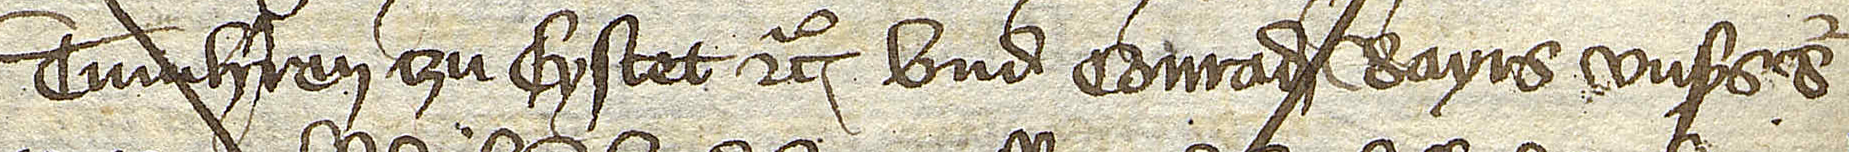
Tumh*ren cʒu Eyſtet ec* vnd Conrad* Bayrs vnſ*s B*
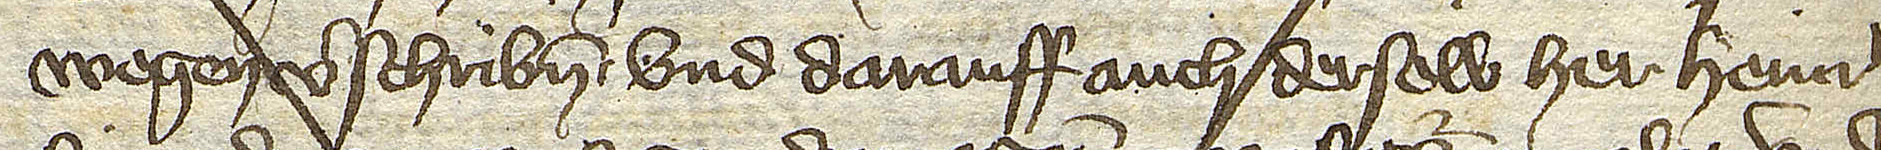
wegen v*ſchribn* vnd darauff auch derſelb her heinr*
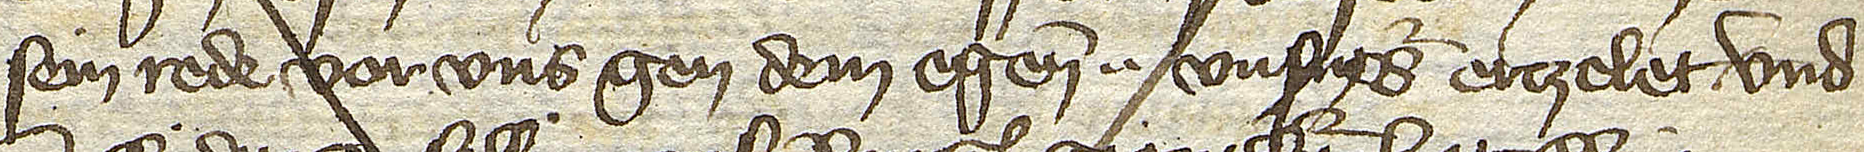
ſein rede vor vns gen dem egen* ~ vnſ*m B* ercʒelet / Vnd
